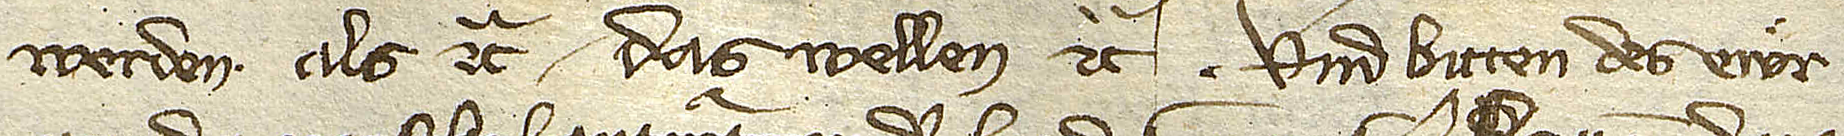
werden . als ec* / das wellen ec* . Vnd bitten des ewr
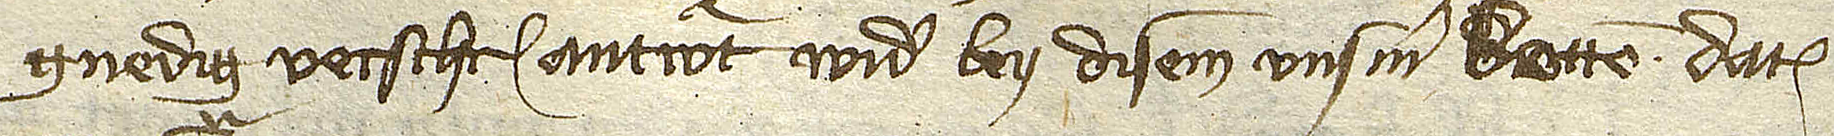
gnedig verſchr* antw*t wid* bey diſem vnſ*m botte* . dat*
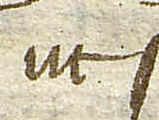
ut ſ*
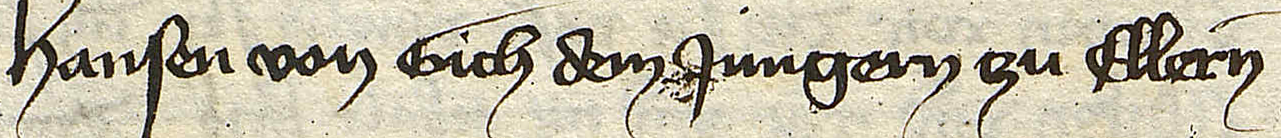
Hanſen von Gich dem Iüngern cʒu Ellern*
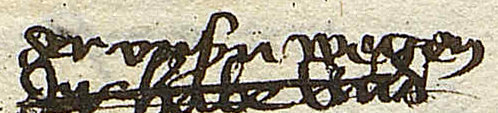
der vnſ*n wegen
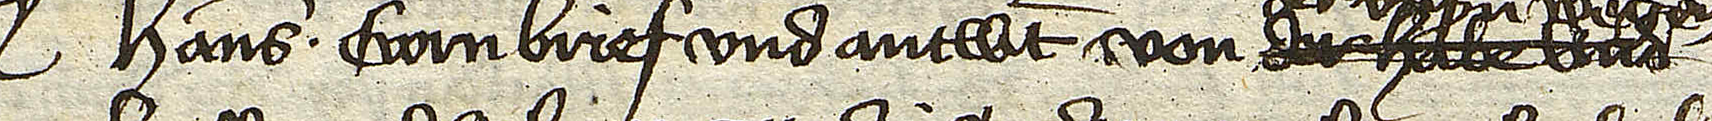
L* Hans* . Ewrn brief vnd antw*t von der habe vnd
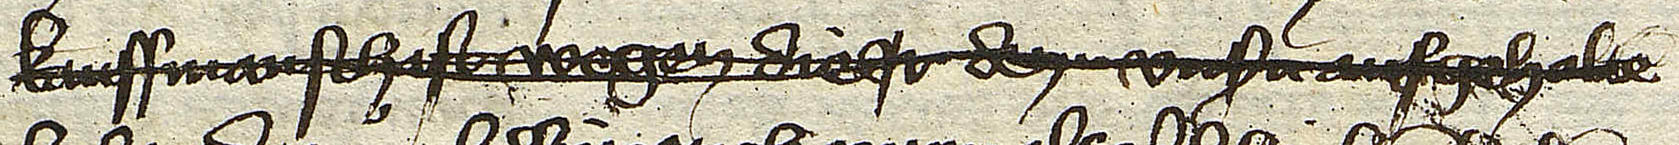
kauffmanſchaft wegen die Ir den ~ vnſ*n aufgehalte*
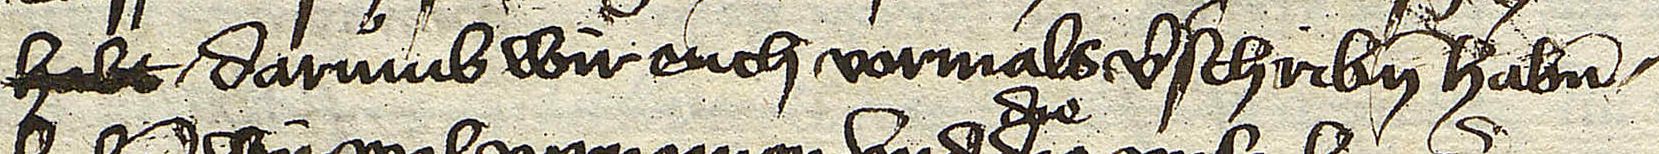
habt / darümb wir euch vormals v*ſchrib*n hab*n /
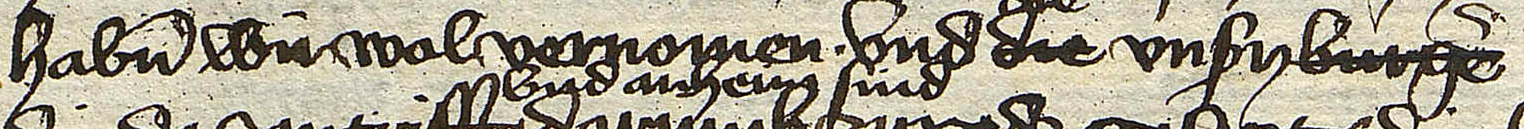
hab*n wir wol vernomen . Vnd die vnſ*n burge*
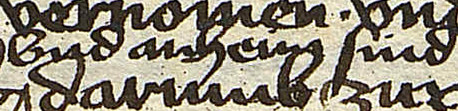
vnd anheim ſind
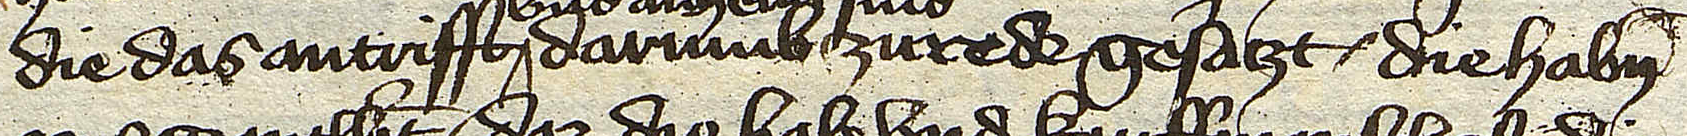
die das antrifft darumb cʒurede geſacʒt / die hab*n
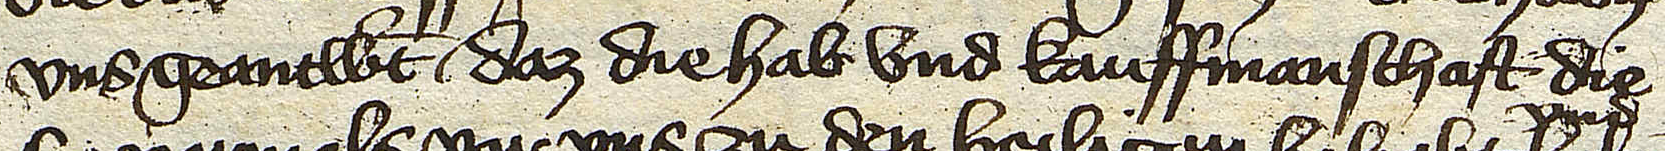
vns geantw*t / daʒ die hab vnd kauffmanſchaft die
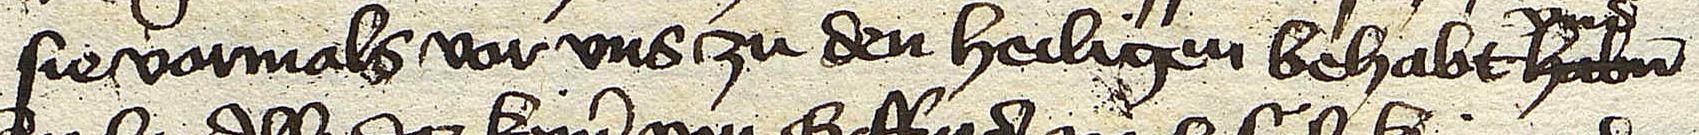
ſie vormals vor vns cʒu den heiligen behabt hab*n
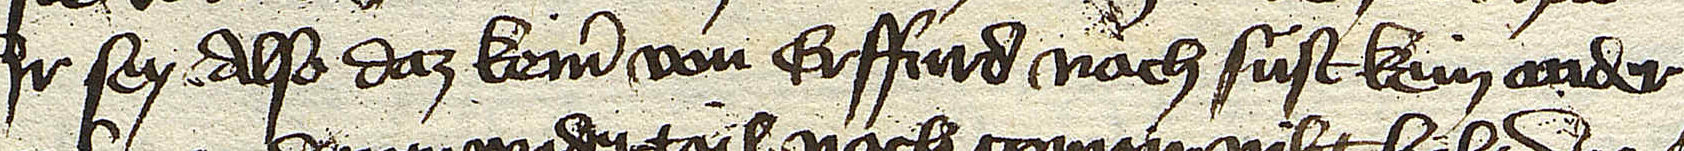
Ir ſey / Alſo daʒ kein* von Erffurd noch ſüſt kein ander
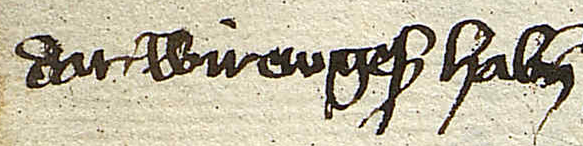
dar* wir ew geſ* hab*n
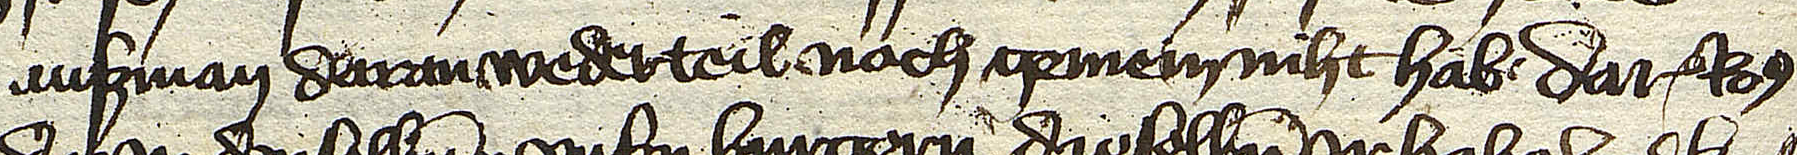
auſʒman daran weder teil noch gemein niht hab . Dar* Ro*
